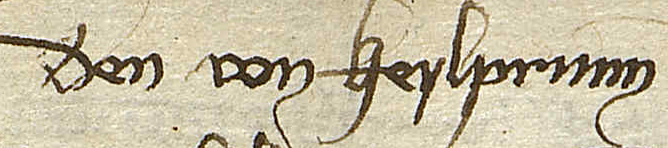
Den von Heylprunn*
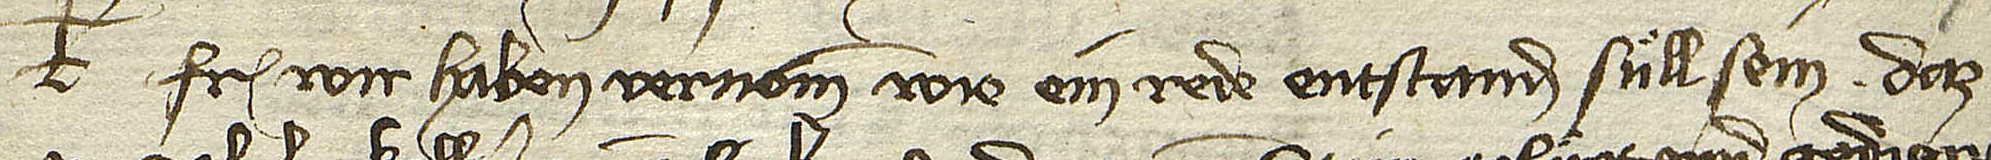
L* fr* wir haben vernom* wie ein rede entſtand* ſüll ſein . daʒ
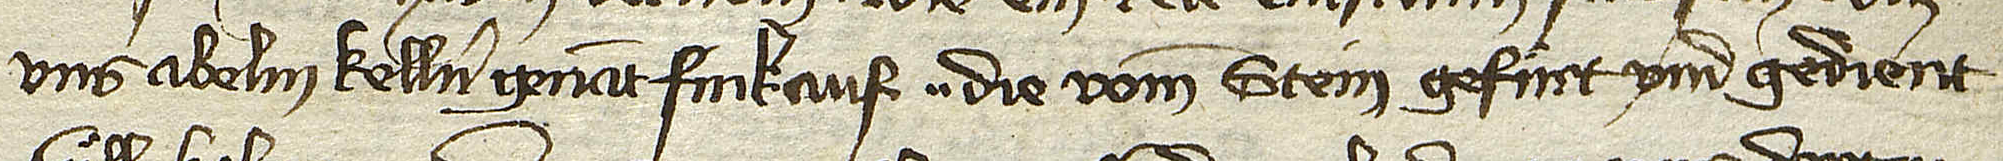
vns abelm kelln* genat* finkvauf ~ die vom* Stein gefürt vnd gedient
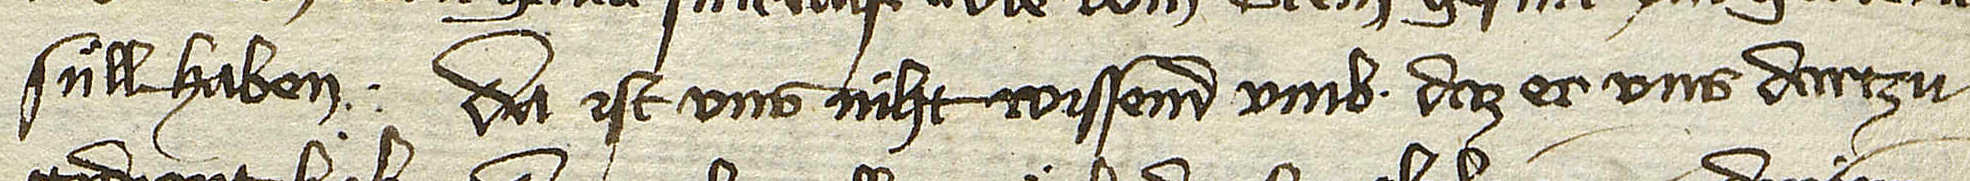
ſüll haben . Da ist vns niht wiſſend vmb . daʒ er vns darcʒu
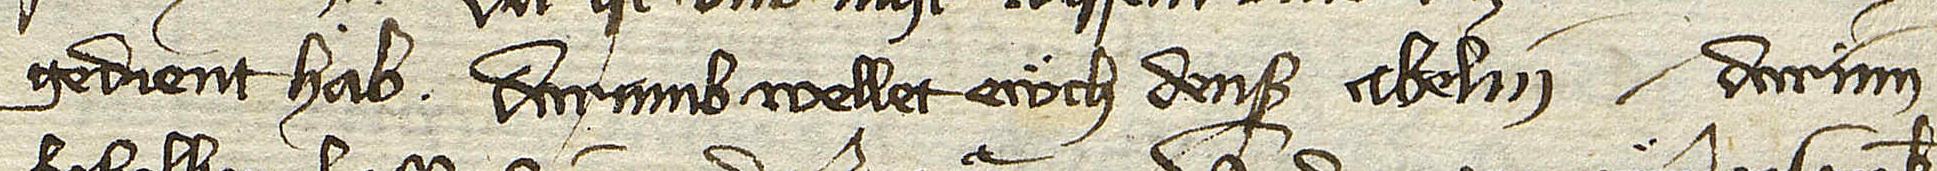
gedient hab . Darumb wellet ewch denſ* abelm* / darinn*
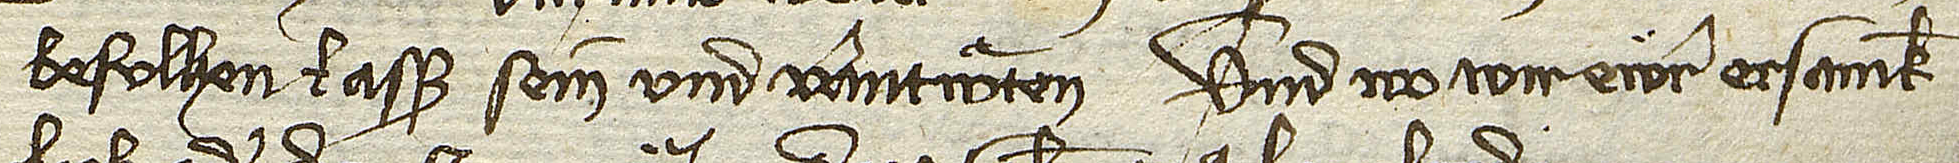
befolhen laſſ* ſein vnd v*antw*ten Vnd wo wir ewr* erſam*k
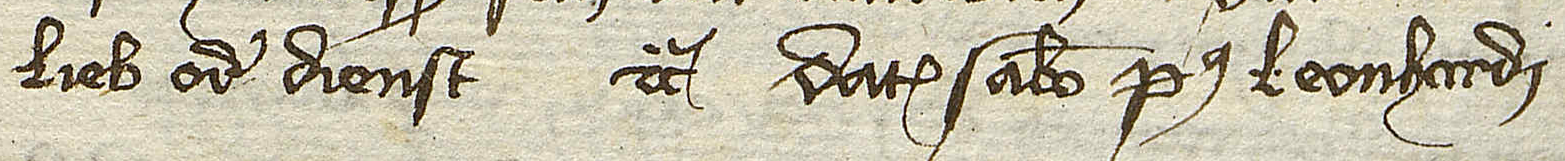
Lieb od* dienſt ec* Dat* ſabo* p* Leonhardi
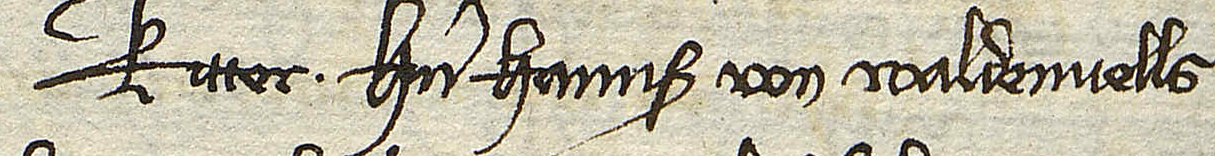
Ritter . Hn* Hannſ* von waldenuells
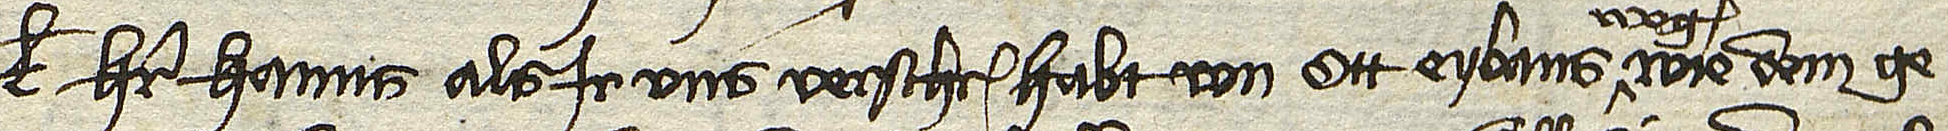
L* hr* Hanns als Ir vns verſchr* habt von Ott eybans wie dem ge =
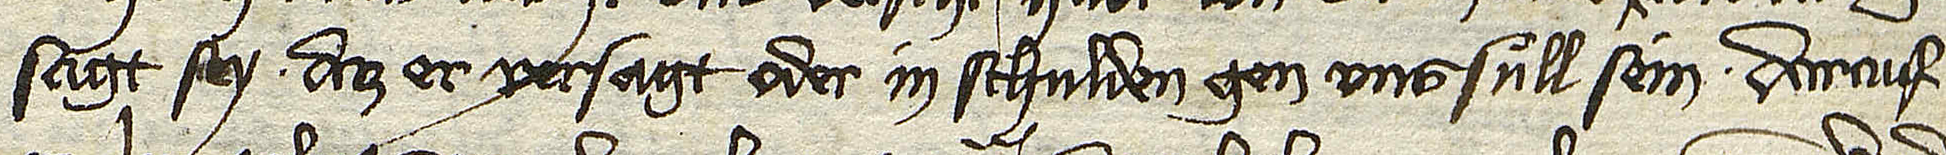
ſagt ſey . daʒ er verſagt oder in ſchulden gen vns ſüll ſein . darauf
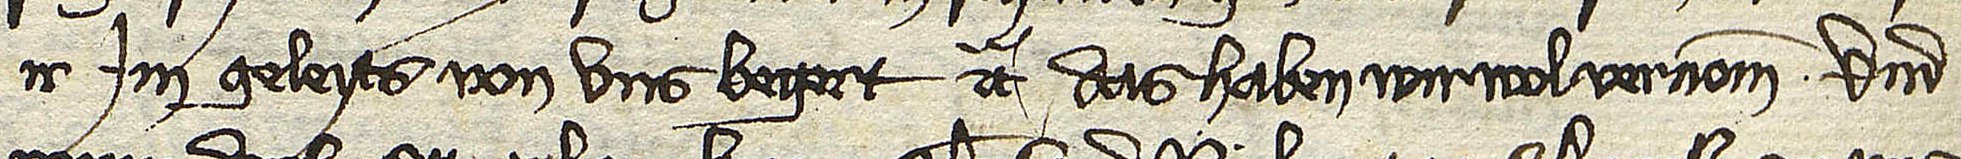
ir Im geleyts von vns begert ec* das haben wir wol vernom* . Vnd
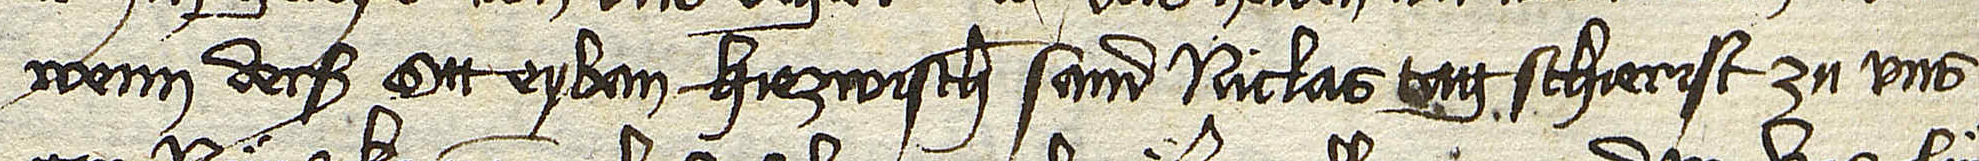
wenn derſ* Ott eyban hieʒwiſch* ſand Nitlas tag ſchieriſt ʒu vns
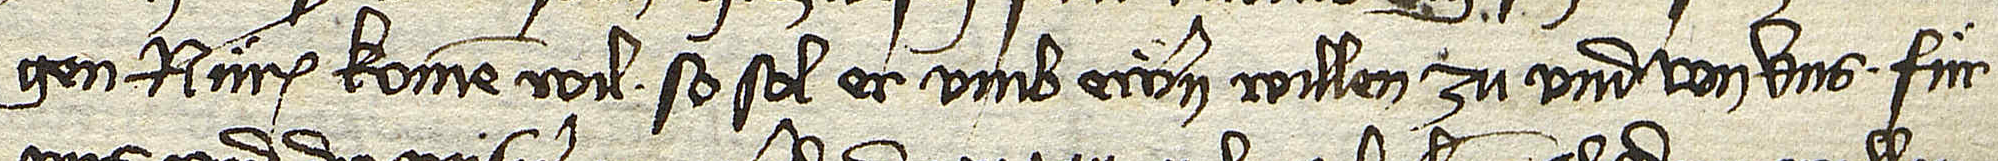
gen Nür* kome* wil . ſo ſol er vmb ew*n willen ʒu vnd von Vns . für
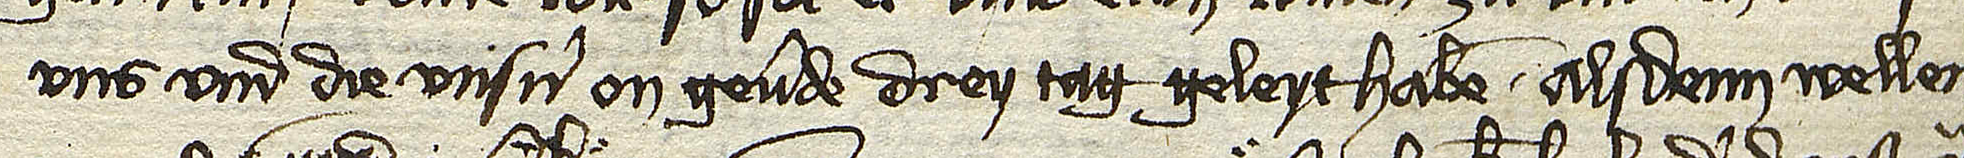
vns vnd die vnſn* on geu*de drey tag geleyt habe* / alſdenn wellen
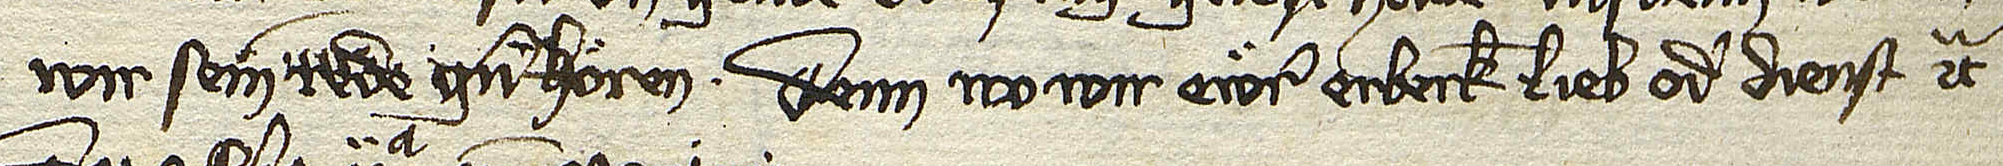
wir ſein rede gn* hören . denn wo wir ewr* erberk* lieb od* dienſt ec*
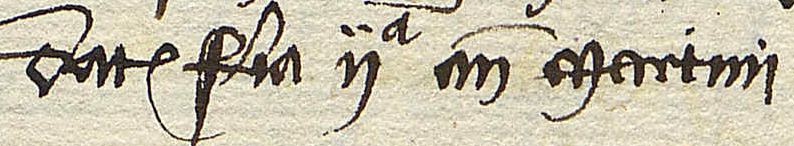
Dat* fi*a ii* an* Martini
